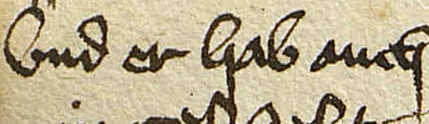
vnd er hab auch
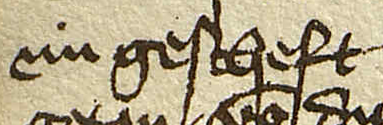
ein geſcheft
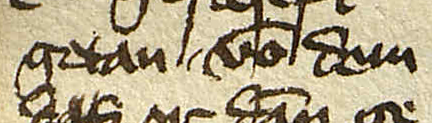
getan / vo* dem
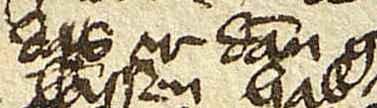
das er dan* ge
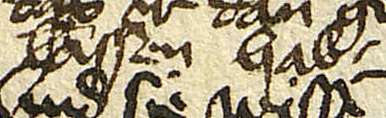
laſſen hab /
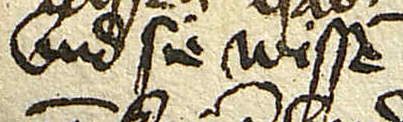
vnd ſie wiſſe*
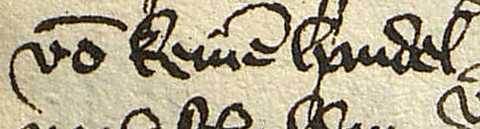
vo* keine* handel
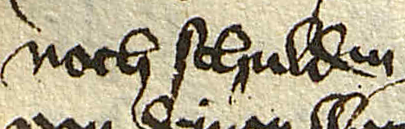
noch ſchulden
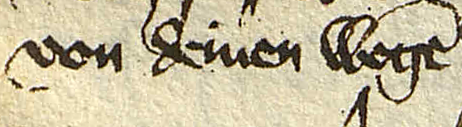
von deinen wege*
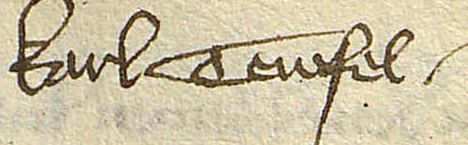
karl Tewfel /
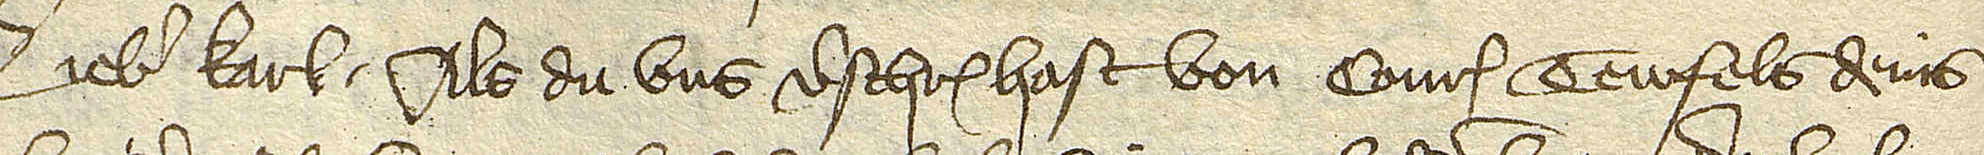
Lieb* karl / Als du vns v*ſchr* haſt von Conr* Tewfels deins
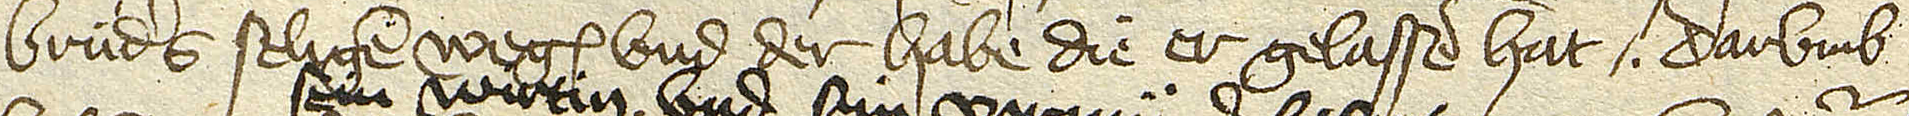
brüds* ſelige* weg* vnd der habe die er gelaſſe* hat / . Darvmb
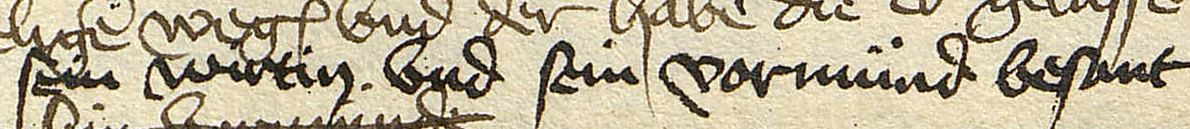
ſein wirtin vnd ſein vormünd beſant
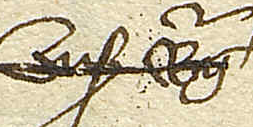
vnſ* B*g*
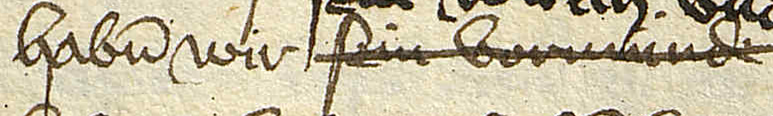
habn* wir ſein vormünde
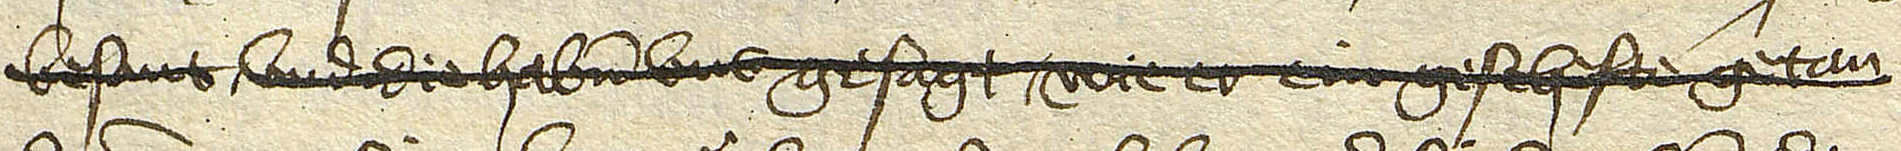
beſant / vnd die habn* vns geſagt / wie er ein geſchefte getan
